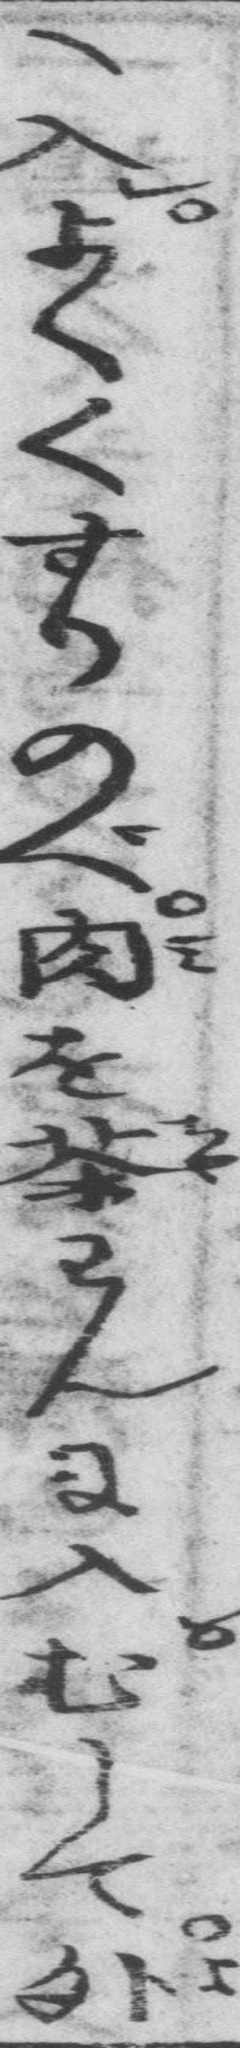へ入れ。よく〳〵すりのべ。肉を茶わんに入れ。むして。外
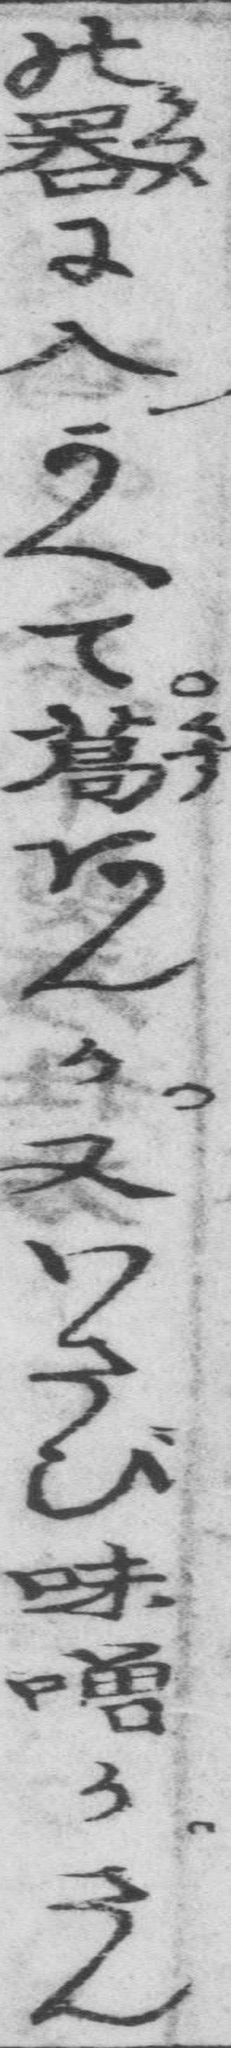の器に入れかへて。葛あんか。又わさび味噌か。さん
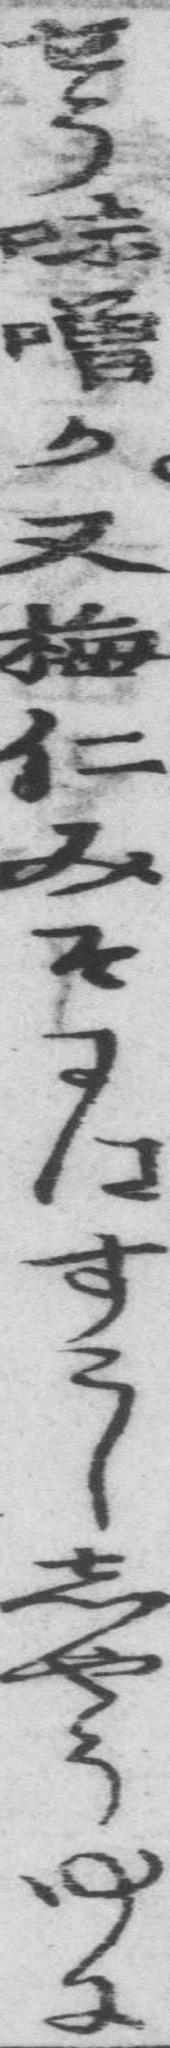せう味噌か。又梅仁みそには。すこししやうゆに。
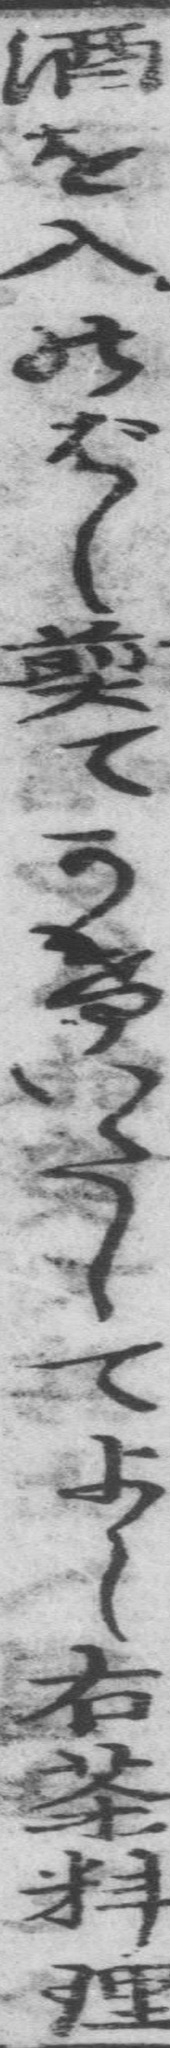酒を入れ。のばし。煎てかけいだしてよし。右茶料理
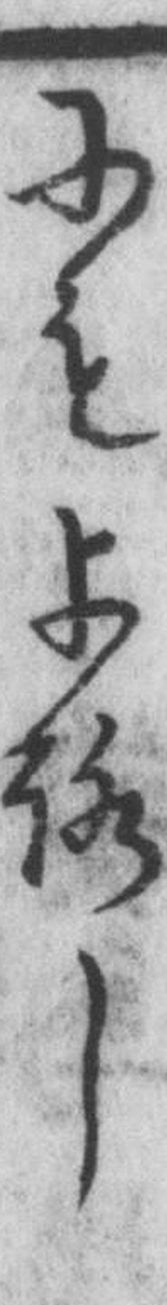にも。よろし

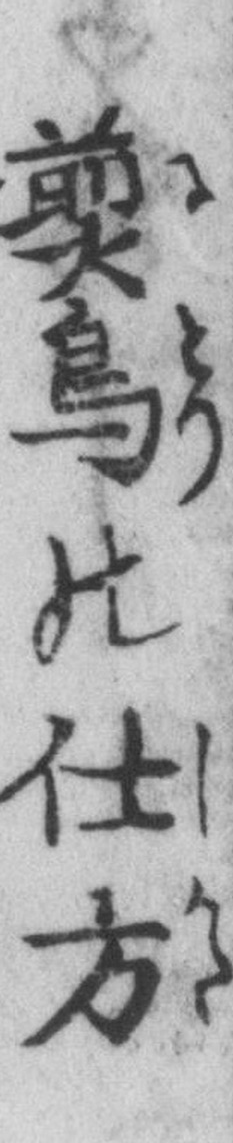煎鳥の仕方
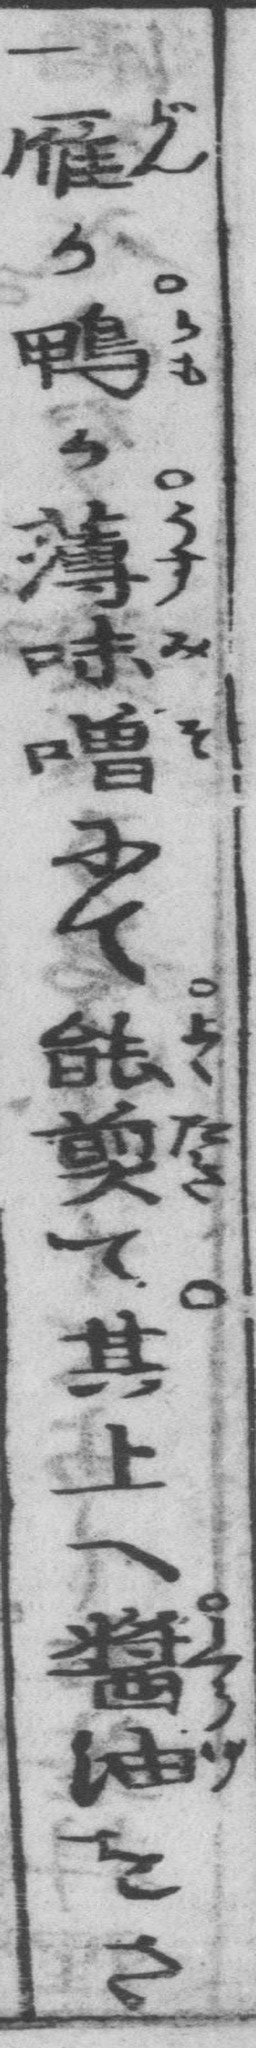一雁か。鴨か。薄味噌にて。能煎て。其上へ醤油をさ
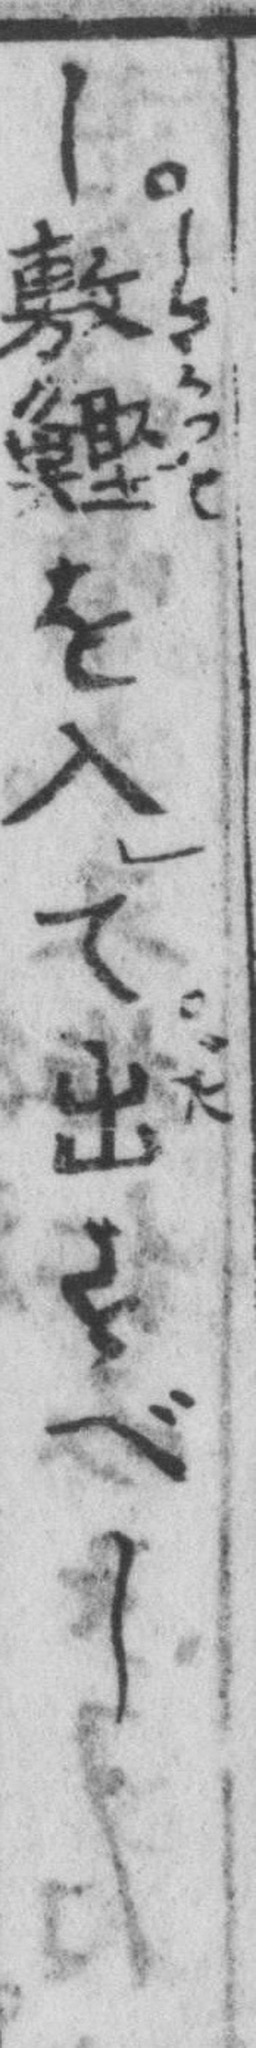し、敷鰹を入れて。出すべし
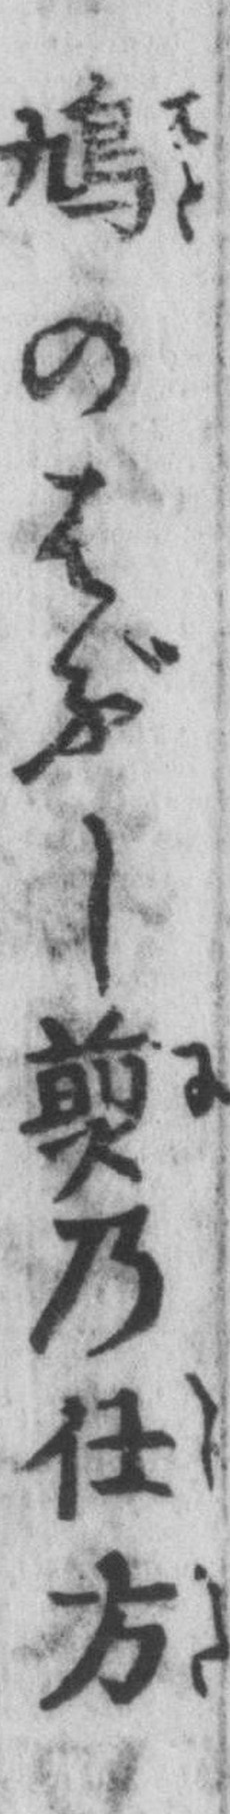鳩のはぶし煎の仕方
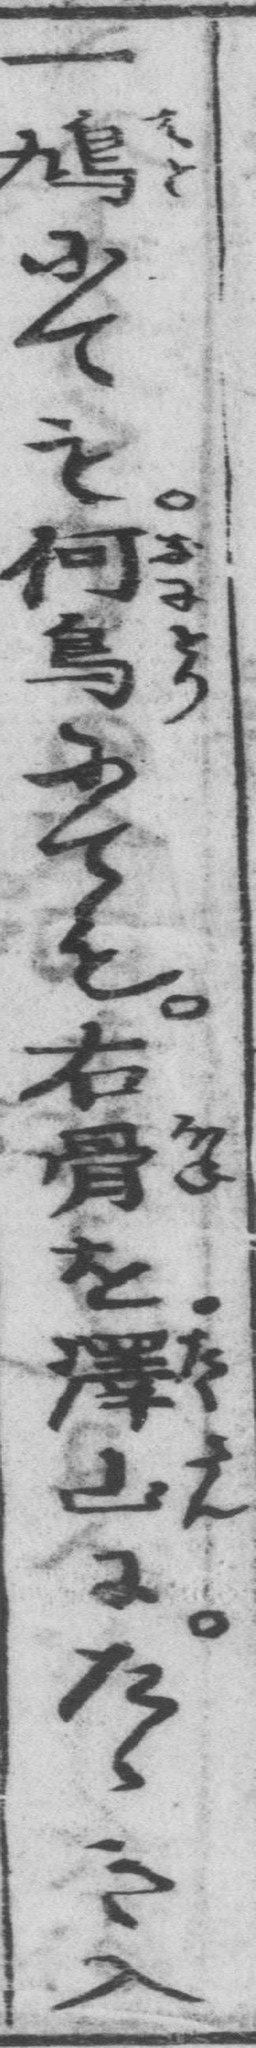一鳩にても。何鳥にても。右骨を。沢山に。たゝき入
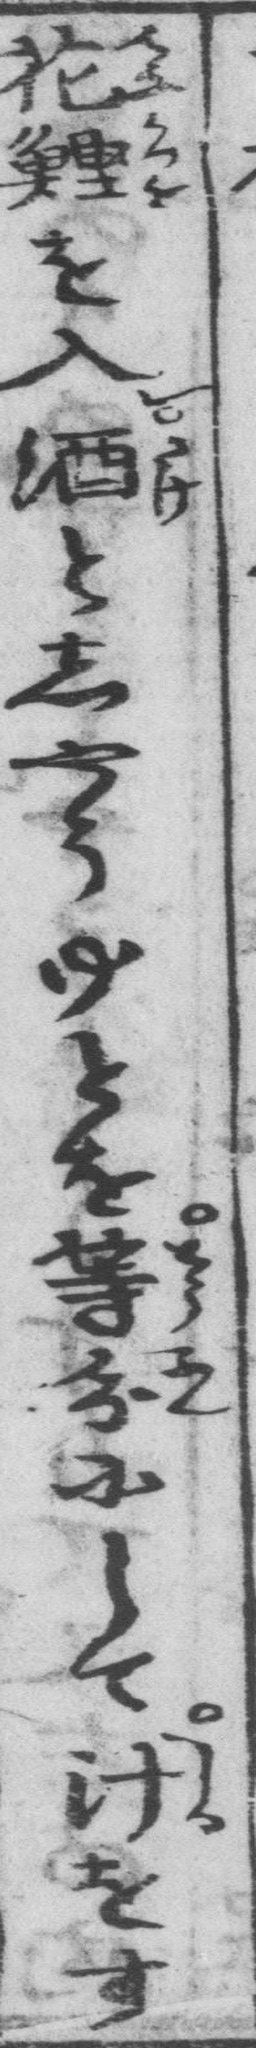花鰹を入れ。酒としやうゆとを。等分にして。汁をす
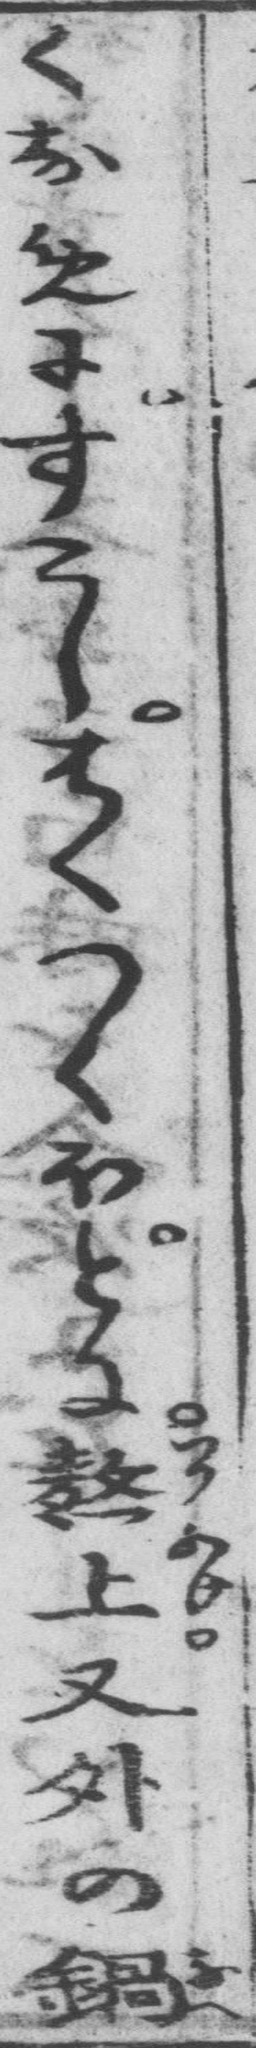くなめに。すこし。はくつくほどに。熬上。又外の鍋
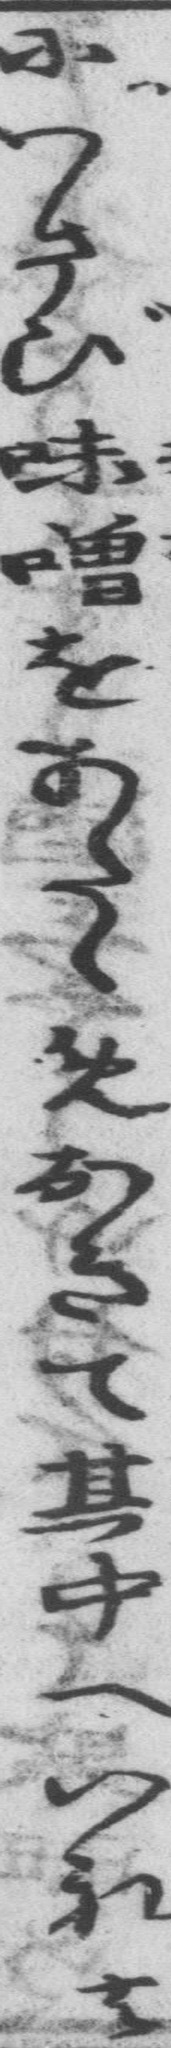に。わさび味噌をあたゝめおきて。其中へいれ。其
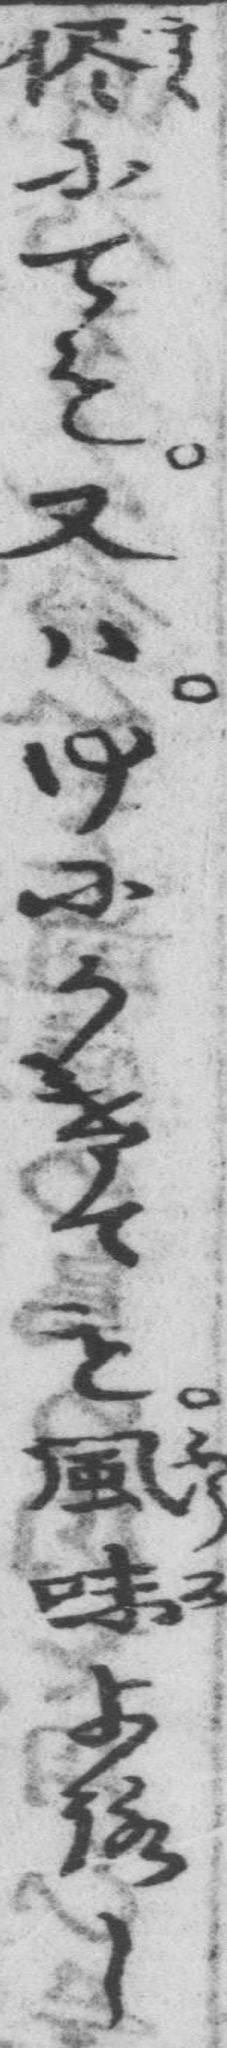侭にても。又は。ゆにかけても。風味よろし
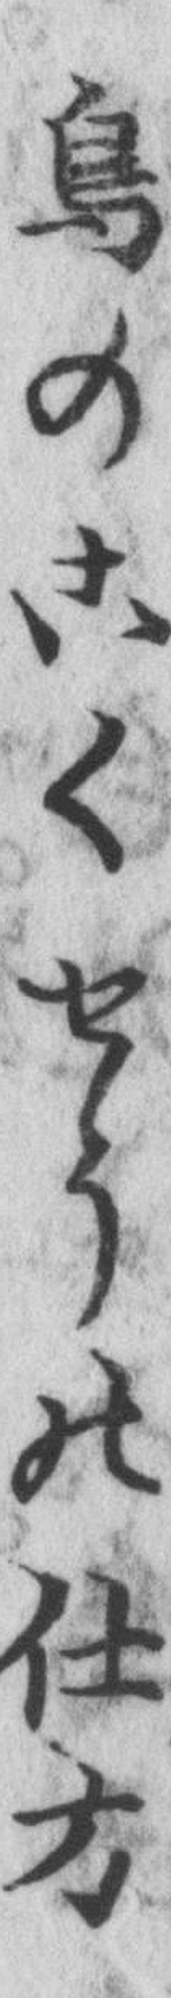鳥のこくせうの仕方
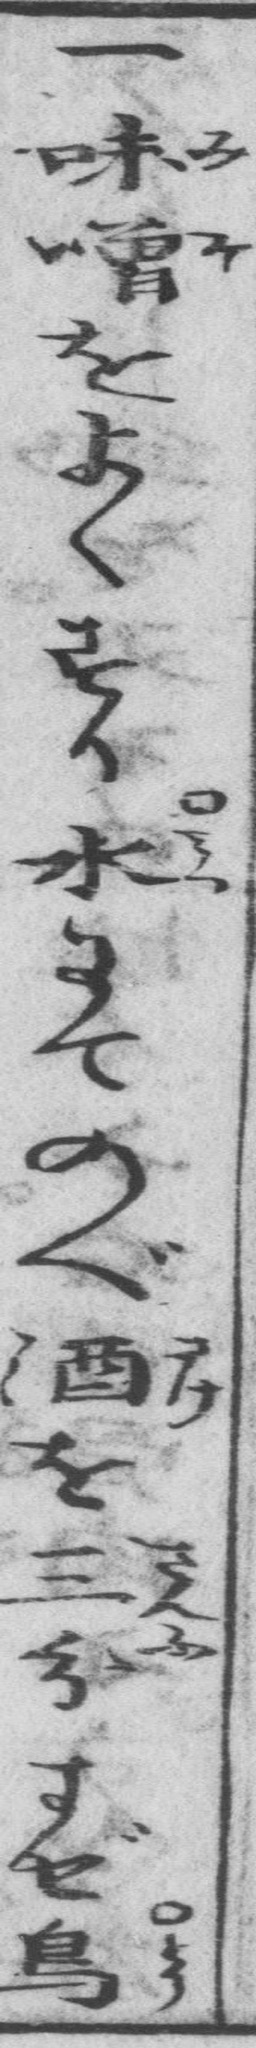一味噌をよくすり。水にてのべ酒を三分まぜ。鳥
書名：萬寳料理秘密箱
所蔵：大阪府立大学学術情報センター 国文学研究資料館
